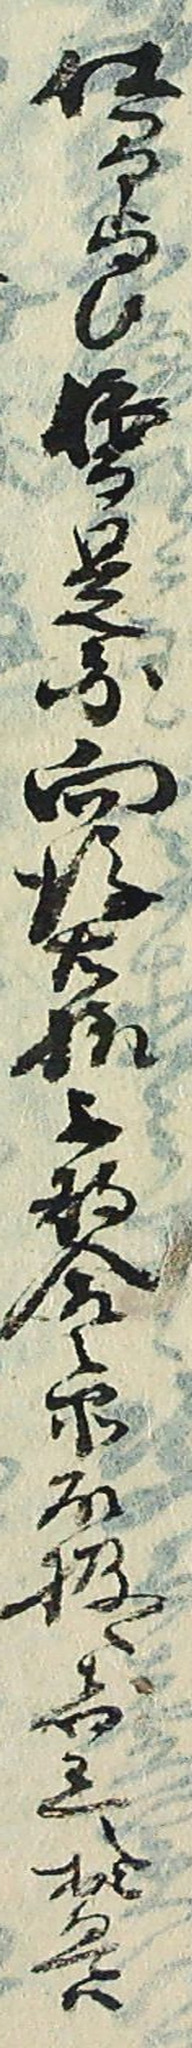仕間布候依而是又向後右様不都合之品取扱候者有之におゐては
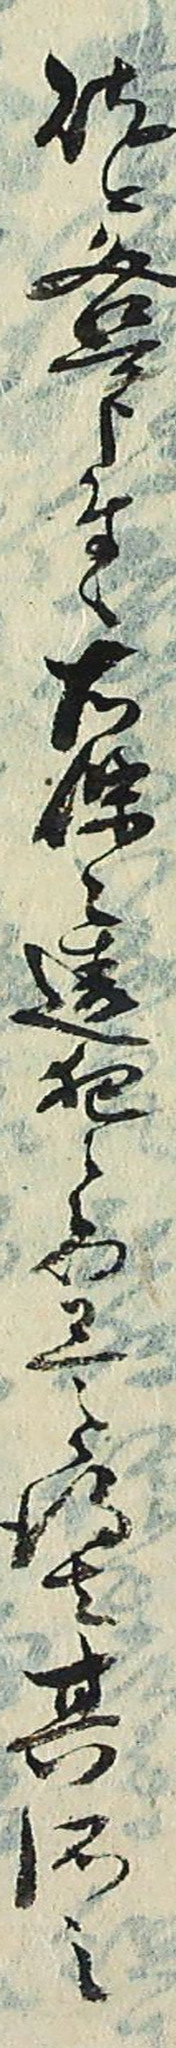屹と咎可申付候右條々違犯之者有之候得者其所之
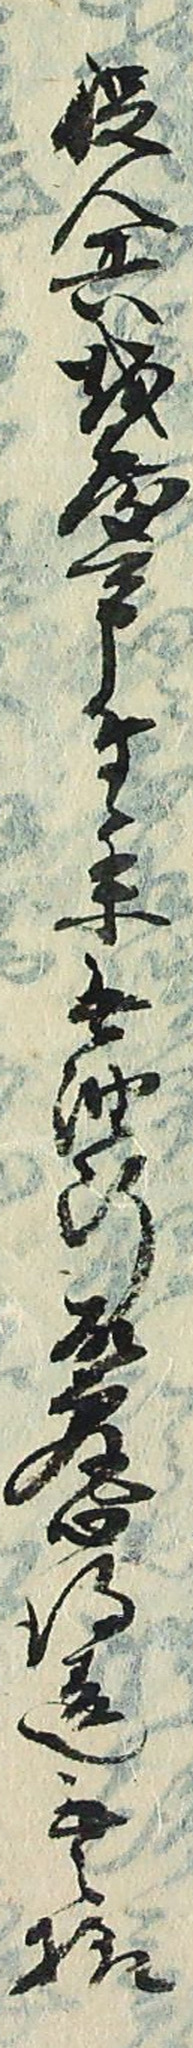役人共越度可申付候条無油断取究心得違無之様
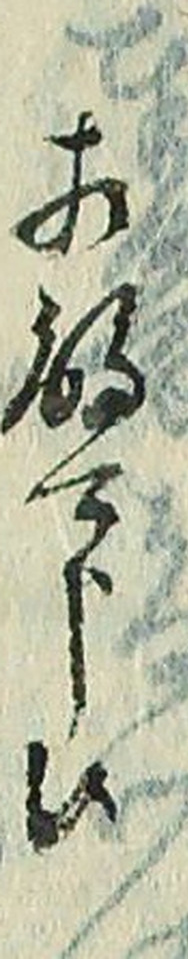相触可申候
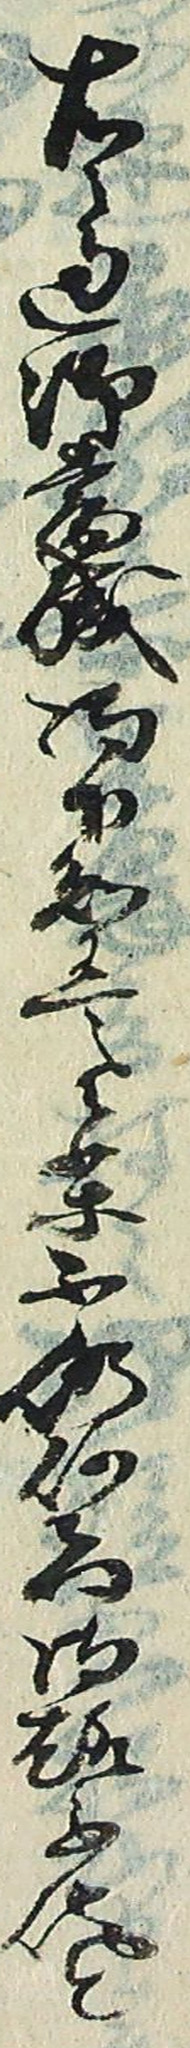右之通御当職御下知有之候条不仍何者御趣意屹と
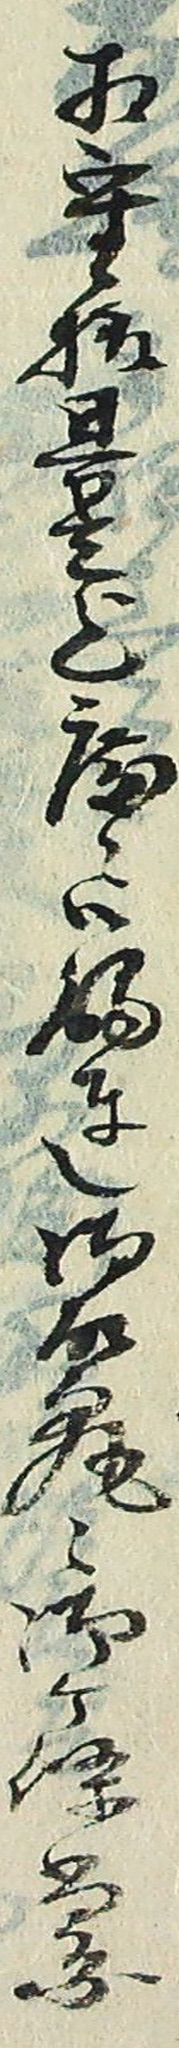相守候様且是迄度々御触達御取究之御ケ條尚亦
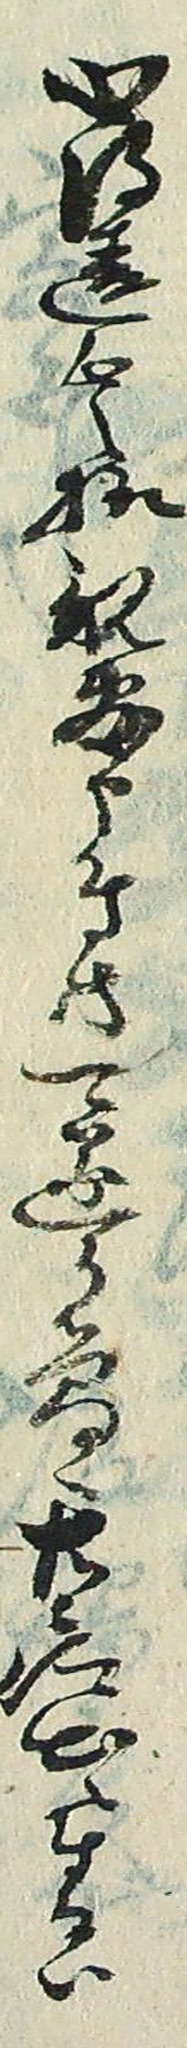心得違無之様親敷申付方可遂了簡候右被仰出
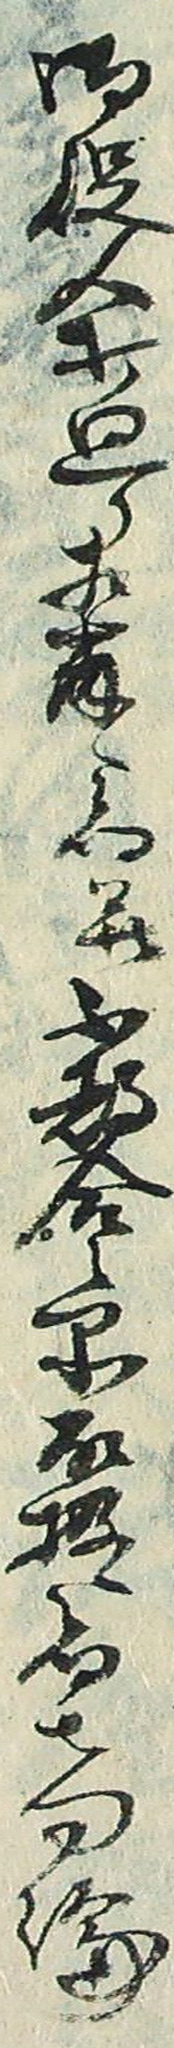御役人打廻り相背候者幷不都合之品取扱候者は勿論
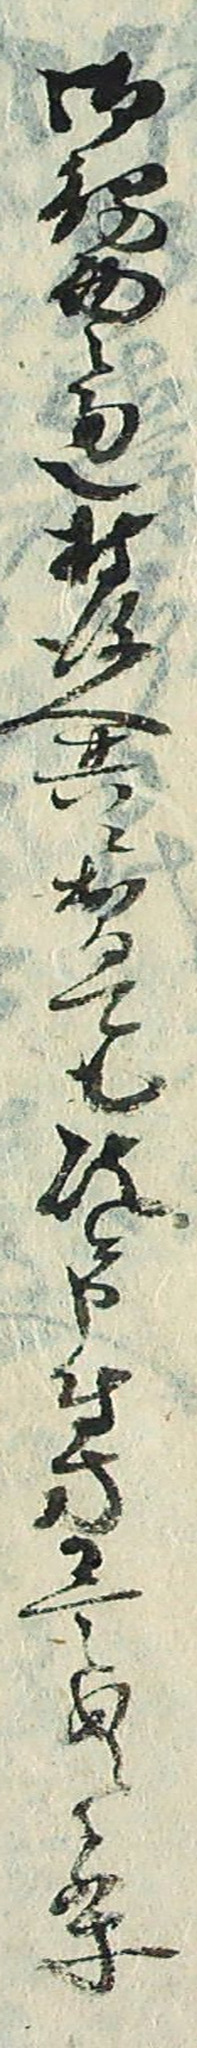御触面之通村役人共におゐても屹と申付方有之義に候条
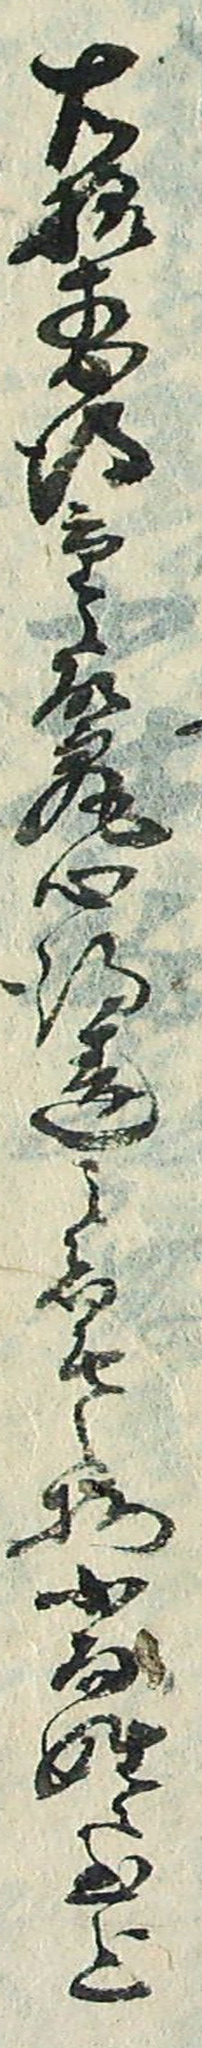右様相心得重々取究心得違之者無之様小百姓に至迄
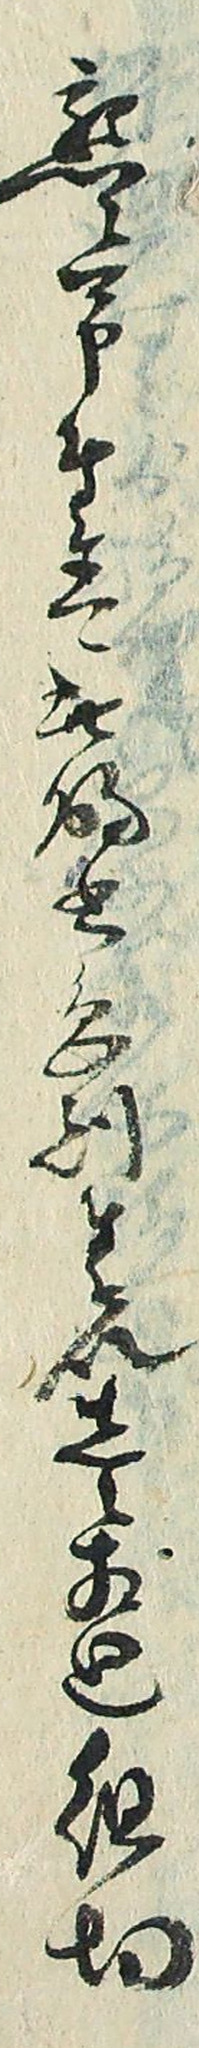懇に可申付置候此触書急刻付を以先々相廻組切

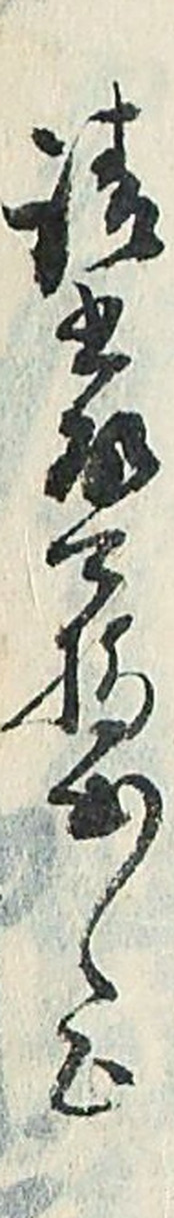請書取可指出候以上
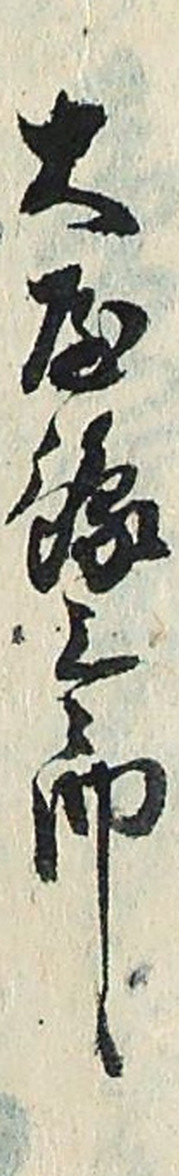大屋豫三郎
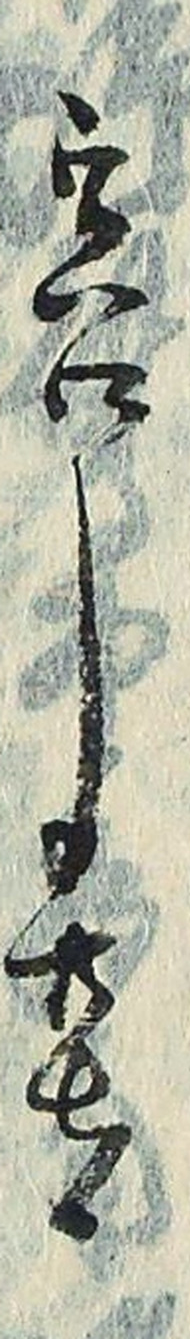寅四月廿七日
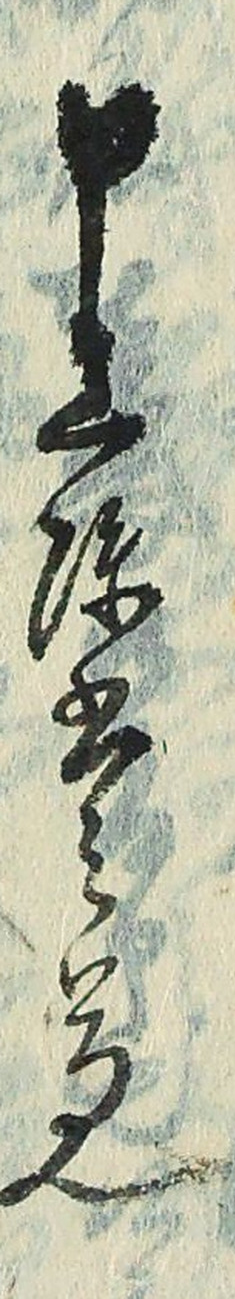申上添書之覚
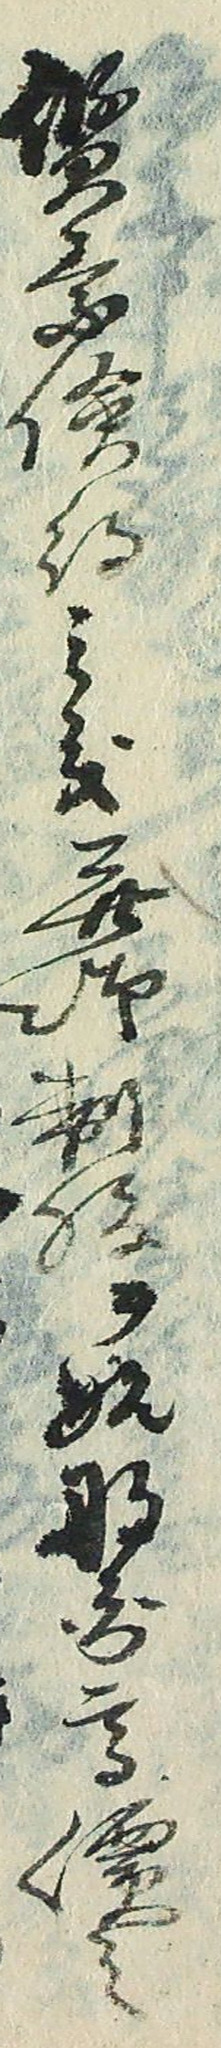質素倹約之義幷御制服を始将亦高価之
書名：諸御用御□受書控
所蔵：鳴門教育大学 Naruto University of Education
